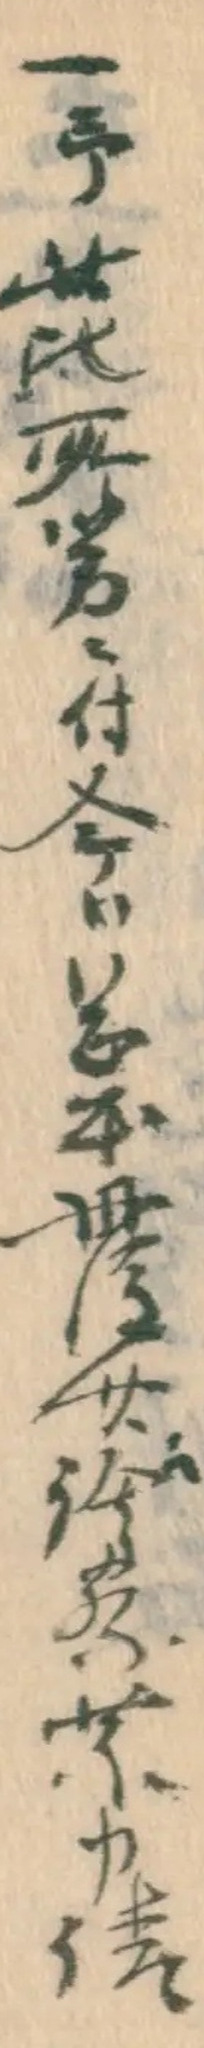一予此頃所労ニ付岡本丹後介え診察薬申請
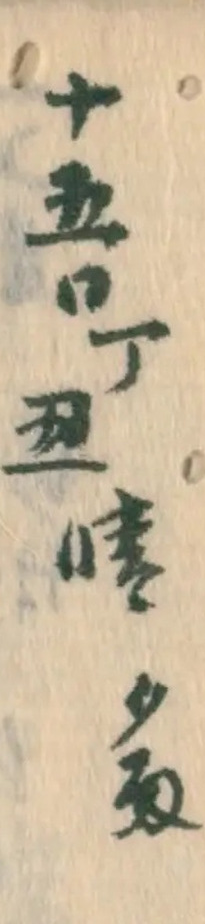十五日丁丑晴夕雨
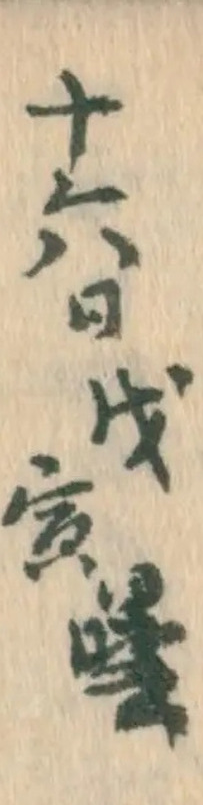十六日戊寅曇
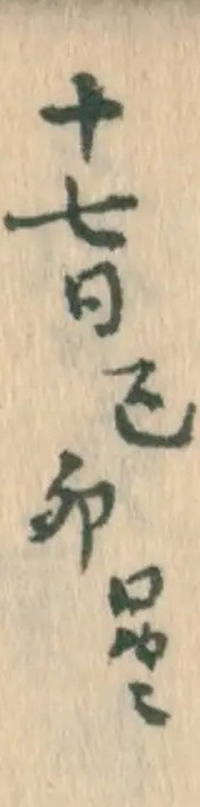十七日己卯曇

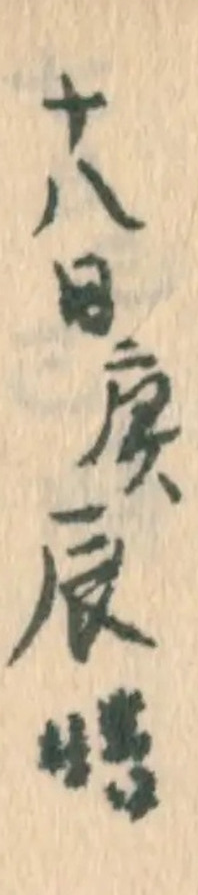十八日庚辰晴
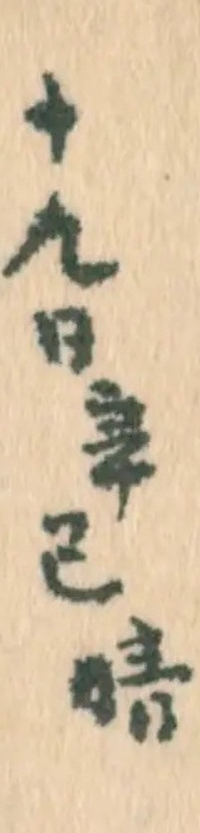十九日辛巳晴
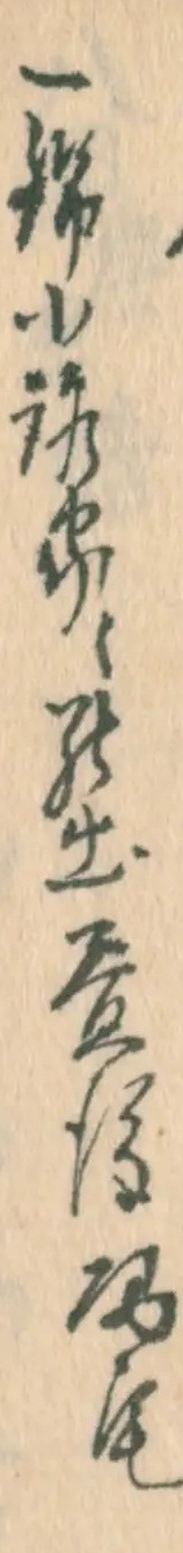一錦小路家へ罷出昼後帰宅
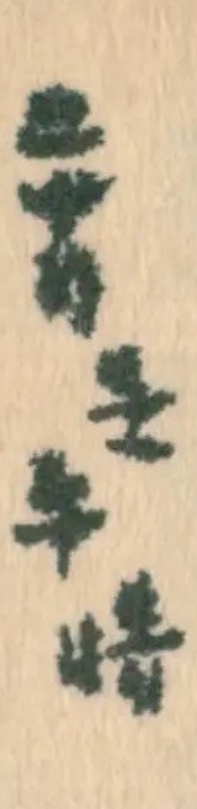二十日壬午晴
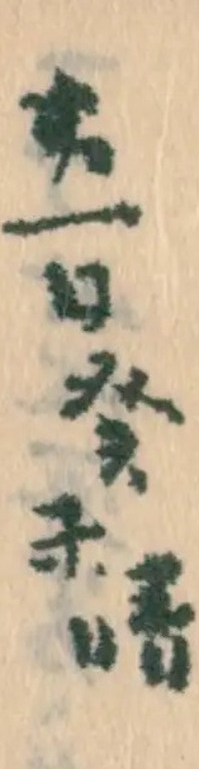廿一日癸未晴
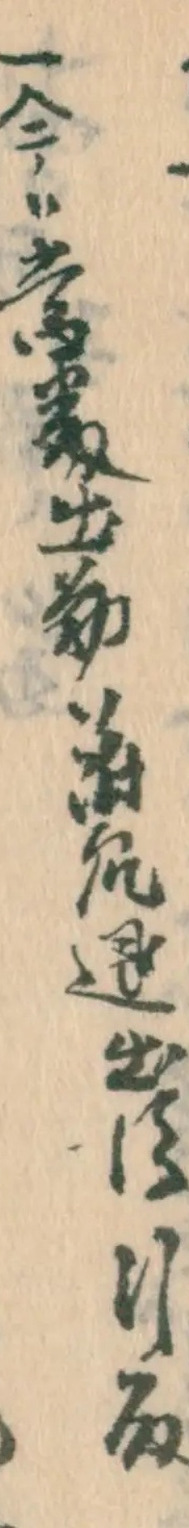一今日当番出勤御附衆退出後引取
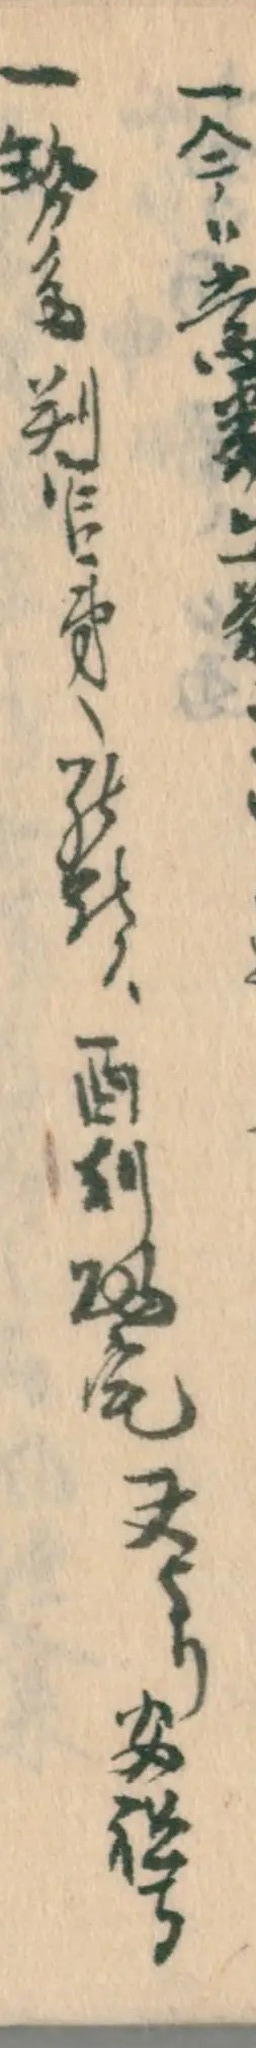一勢多判官第へ罷越ス酉刻帰宅夫より安禅寺
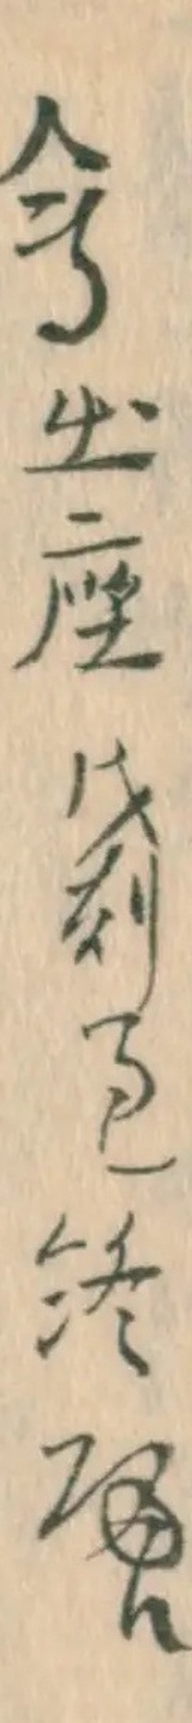会出座戌刻過終帰ル
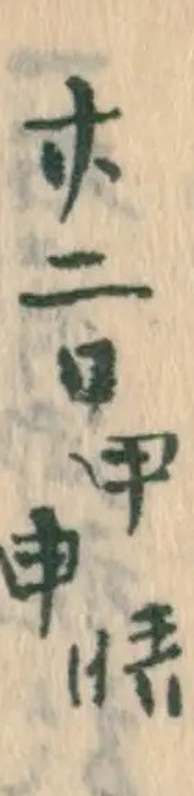廿二日甲申晴
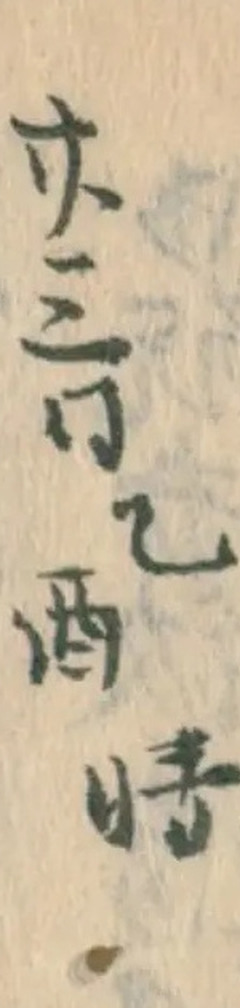廿三日乙酉晴
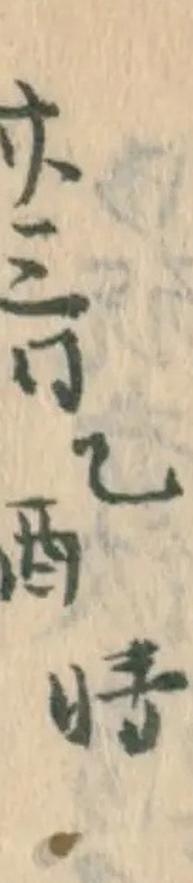廿三日乙酉晴
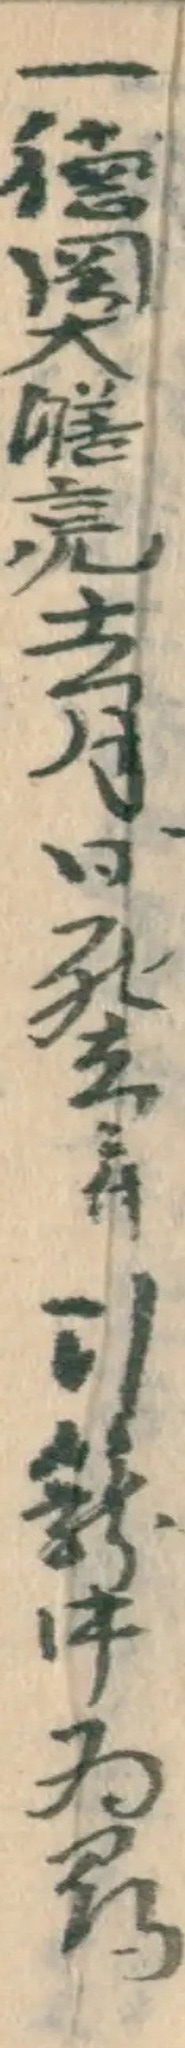一徳岡大膳亮去月十一日夜死去ニ付引籠中為尋
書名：禁裏御所御用日記. [131]
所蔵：国立国会図書館 National Diet Library, JAPAN
